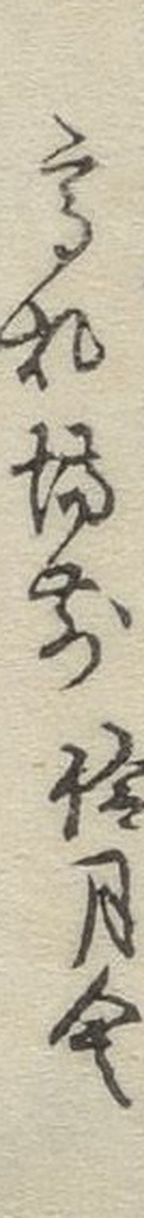高札場前伶月舎
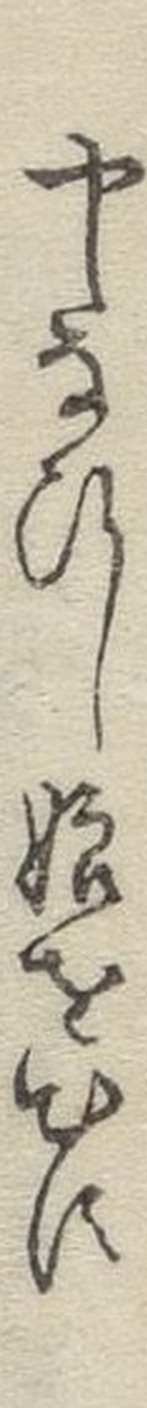やしなひし娘を出す
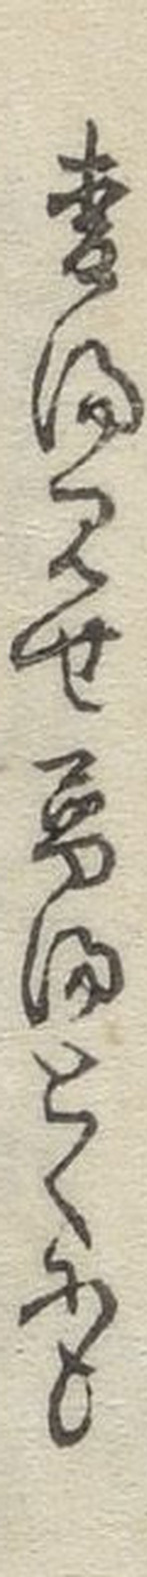麦湯見世勇湯とくにも
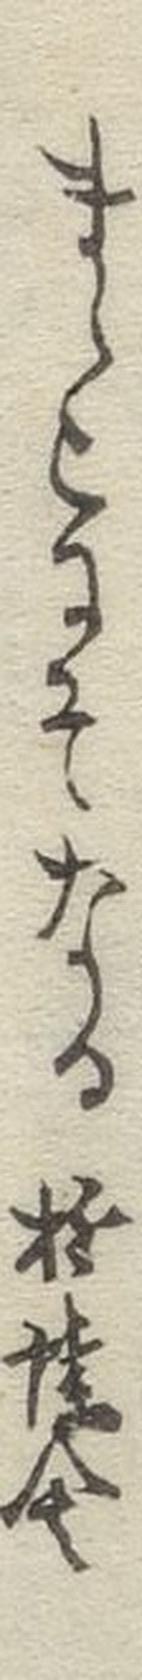まゝこにそなる遊蝶舎
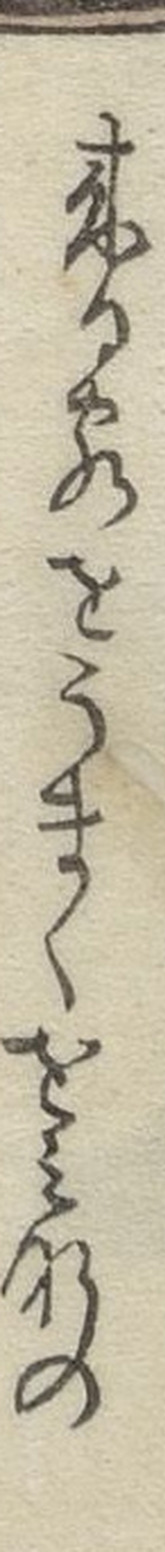来る客をうまくをみなの
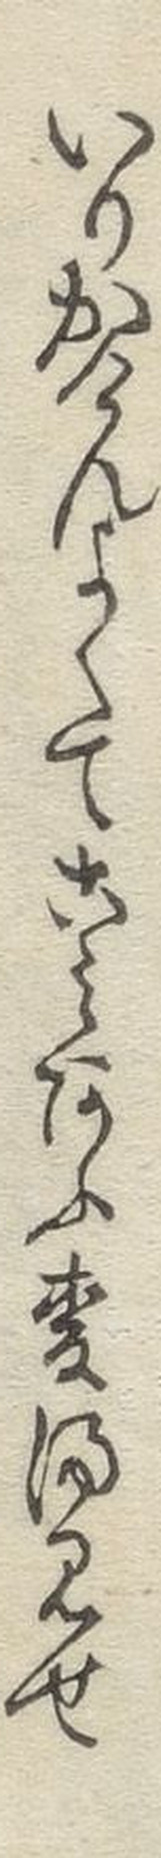いりかけんよくてこみあふ麦湯見せ松の門
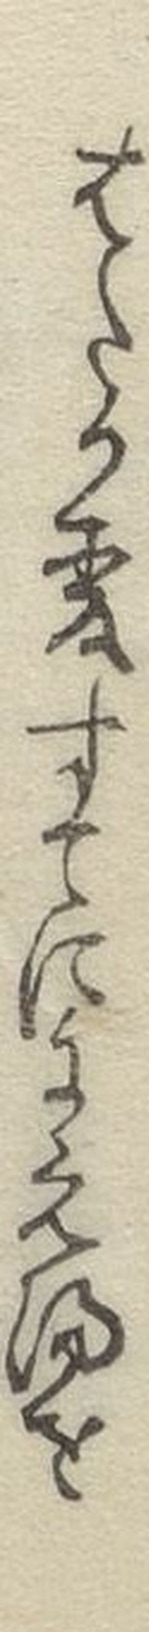はたか麦すてに元湯を
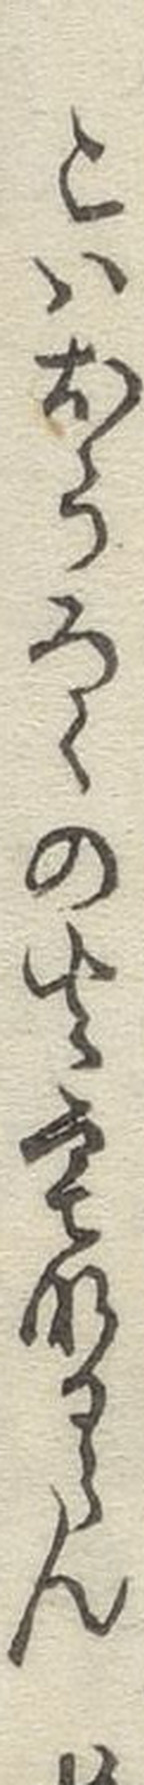こはほうろくの火宅なるらん鶴子
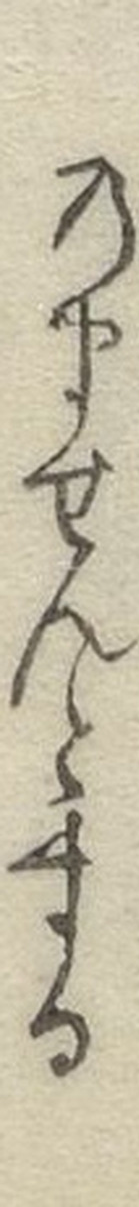のませんとする
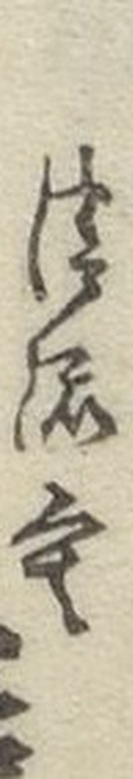清流舎
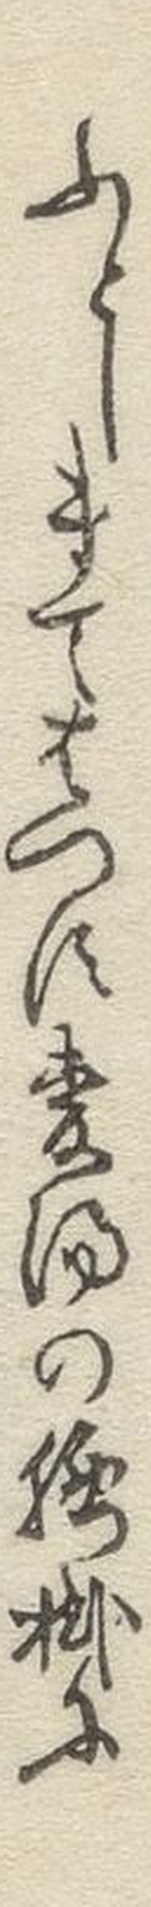ふとしまてはつす麦湯の腰掛に
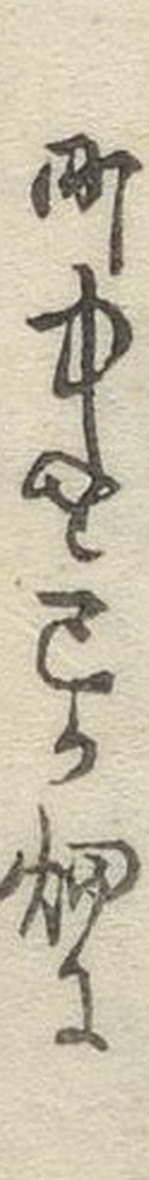町中を己か畑に
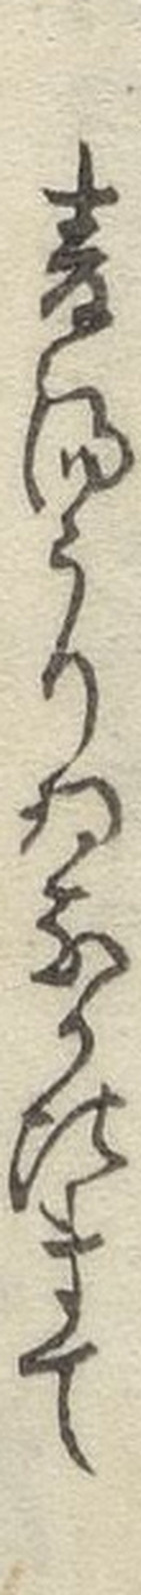麦湯うり夜なか比まて
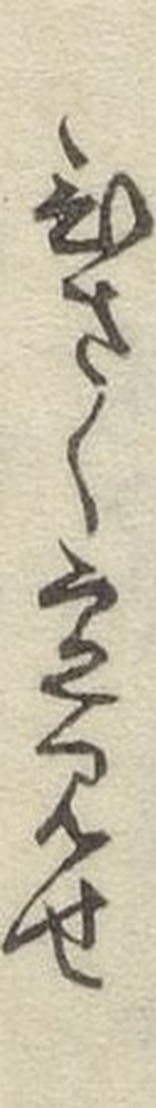ひさく定見せ
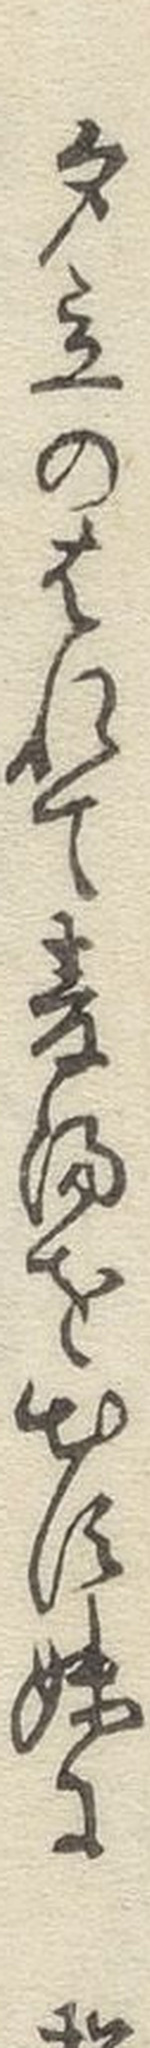夕立のはれて麦湯を出す妹に松代
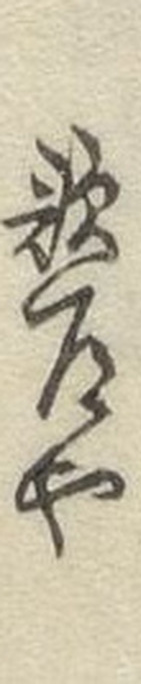歌道や
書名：Picture Album of People with Kyōka (Light Verse) (Kyōka shiki jinbutsu 狂歌四季人物)
